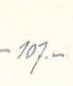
12
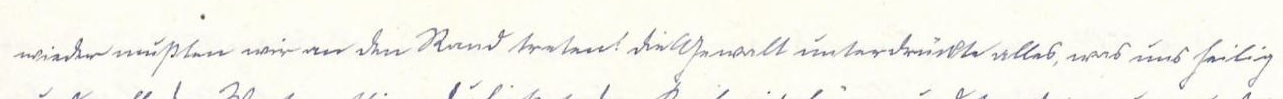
wieder mußten wir an den Rand treten! Die Gewalt umterdrückte alles, was uns heilig
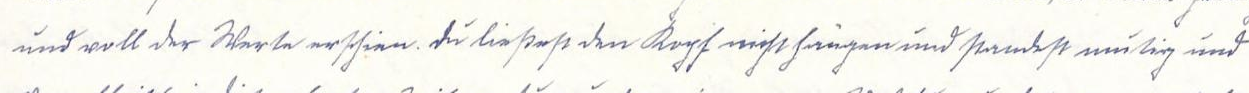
und voll der Werte erschien. Du ließest den Kopf nicht hängen und standest mutig und
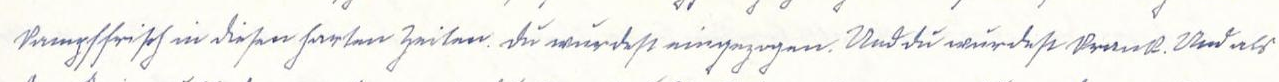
kampffrisch in diesen harten Zeiten. Du wurdest eingezogen. Und du wurdest krank. Und als
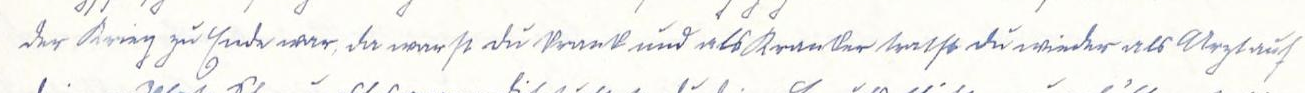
der Krieg zu Ende war, da warst du krank und als kranker tratst du wieder als Arzt auf
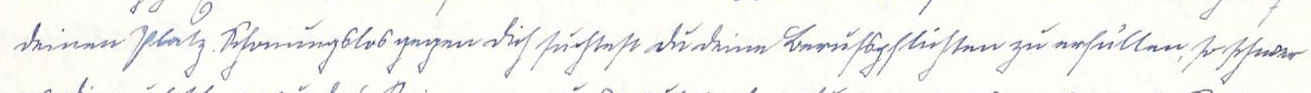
deinen Platz. Schonungslos gegen dich suchtest du deine Berusspflichten zu erfüllen, so schwer
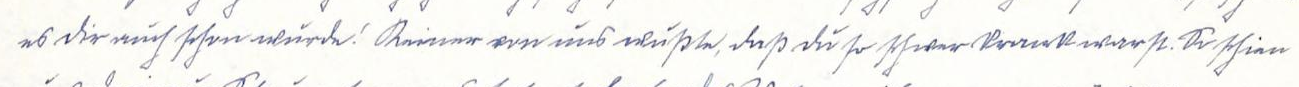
es dir auch schon wurde! Keiner von uns wusste, daß du so schwer krank warst. So schien
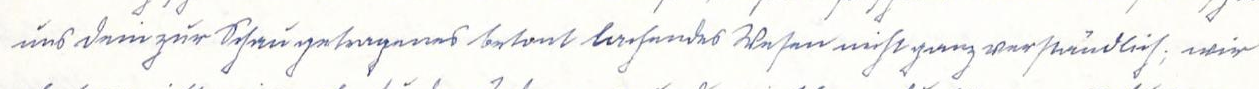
uns dein zur Schau getragenes betont lachendes Wesen nicht ganz verständlich, wir
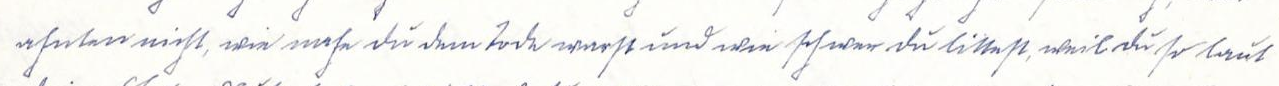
ahnten nicht, wie nahe du dem Tode warst und wie schwer du littest, weil du so laut
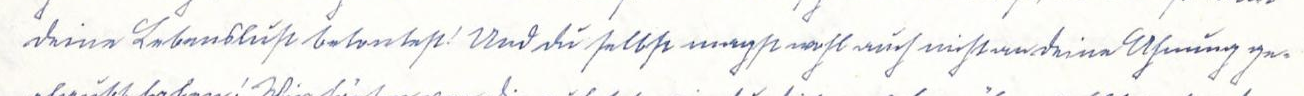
Deine Lebenslust betontest! Und du selbst magst wohl auch nicht an deine Ahnung ge-
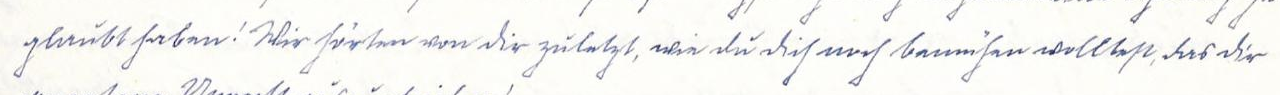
glaubt haben! Wir hörten von dir zuletzt, wie du dich noch bemühen wolltest, das Dir
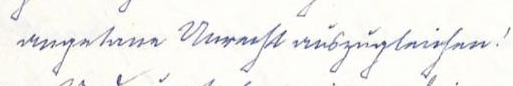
angetane Unrecht auszugleichen!
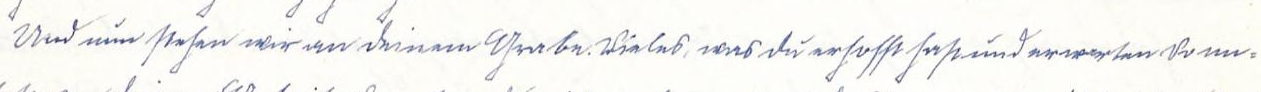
Und nun stehen wir an deinem Grabe. Vieles, was du erhofft hast und erwarten konn-
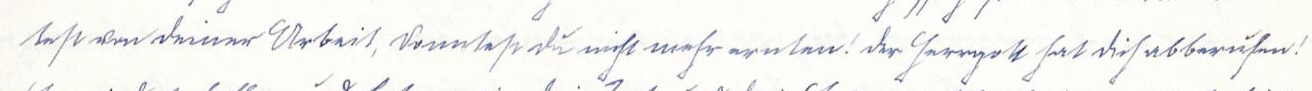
test von deiner Arbeit, konntest du nicht mehr ernte!. Der Herrgot hat dich abberufen!
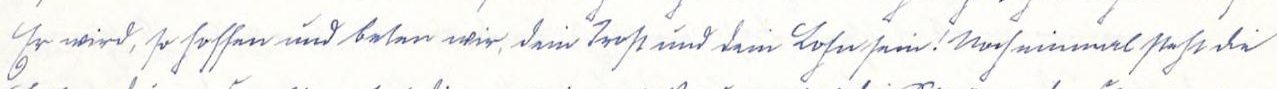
Er wird, so hoffen und beten wir, dein Trost und dein Lohn sein! Noch einmal steht die
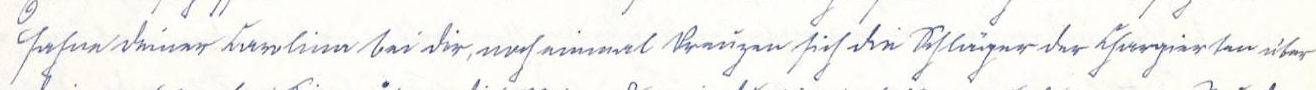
Fahne deiner Carolina bei dir, noch einmal kreuzen sich die Schläger der Chargierten über
